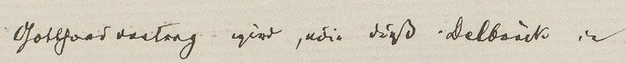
Gotthardvertrag wird, wie dieß Delbrück in
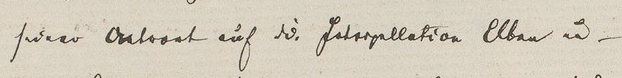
seiner Antwort auf die Interpellation Elben un-
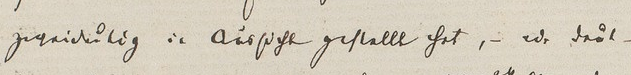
zweideutig in Aussicht gestellt hat, – ein deut-
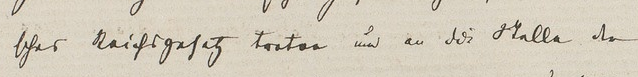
sches Reichsgesetz treten nun an die Stelle der
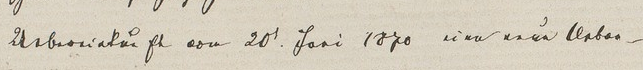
Uebereinkunft vom 20t Juni 1870 eine neue Ueber-
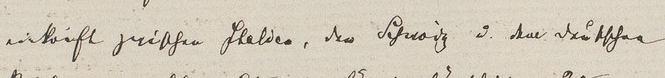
einkunft zwischen Italien, der Schweiz u. dem Deutschen
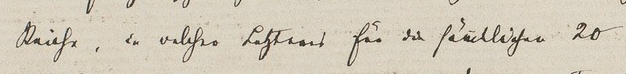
Reiche, in welcher Letzteres für die sämmtlichen 20
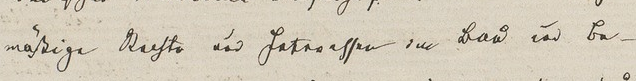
mäßige Rechte und Interessen im Bau und Be-
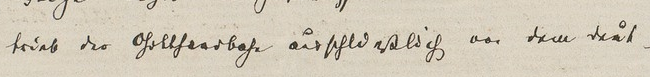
trieb der Gotthardbahn ausschließlich von dem deut-
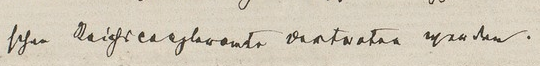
schen Reichscanzleramte vertreten werden.
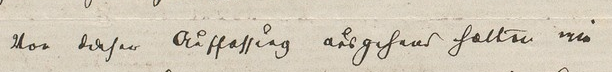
Von dieser Auffassung ausgehend halten wir
